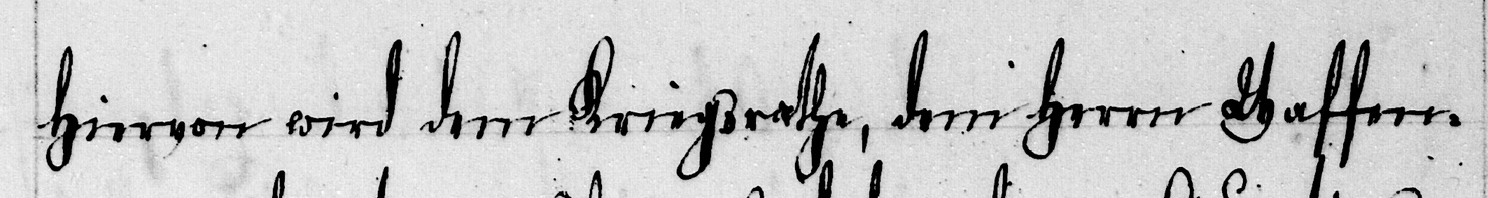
Hiervon wird dem Kriegsrathe, dem Herrn Waffe¬
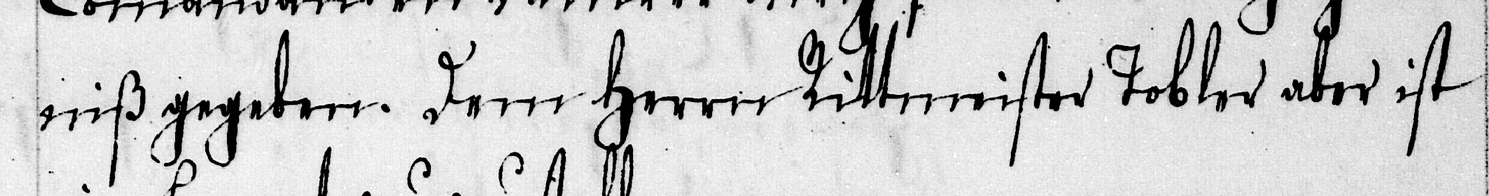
niß gegeben. Dem Herrn Rittmeister Tobler aber ist
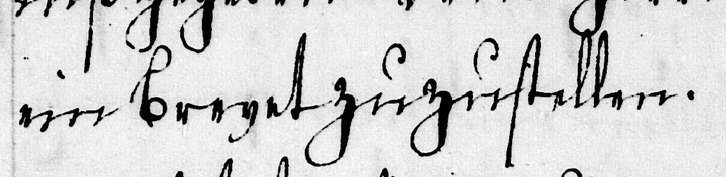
ein Brevet zuzustellen.
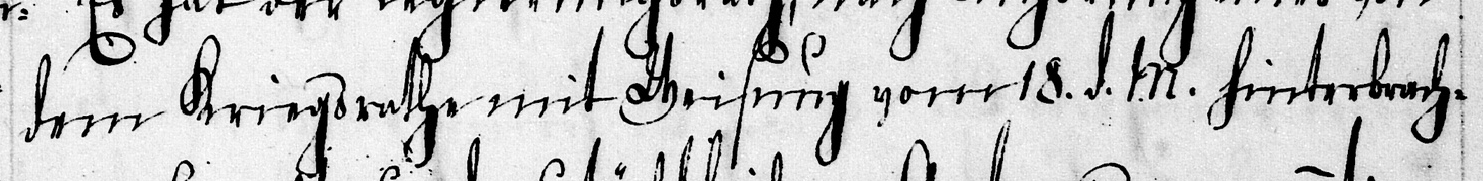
dem Kriegsrathe mit Weisung vom 18. d. M. hinterbrach¬
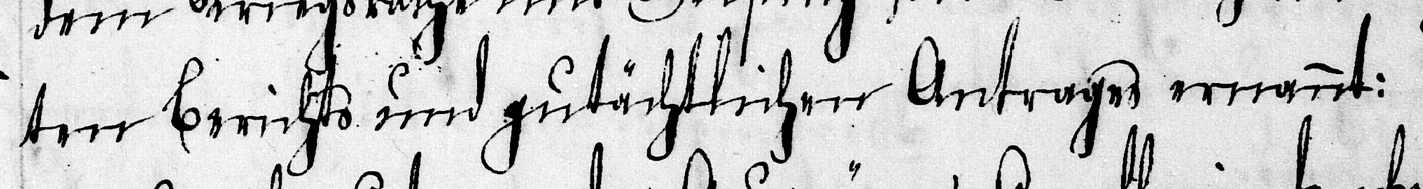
ten Berichts und gutächtlichen Antrages ernannt:
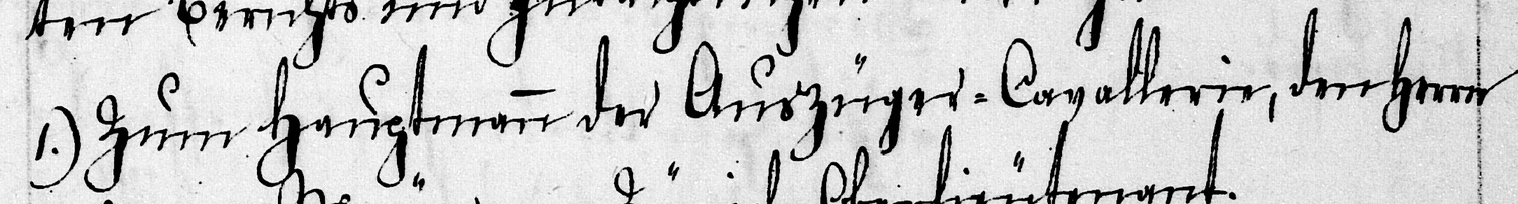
1.) Zum Hauptmann der Auszüger-Cavallerie, den Herrn
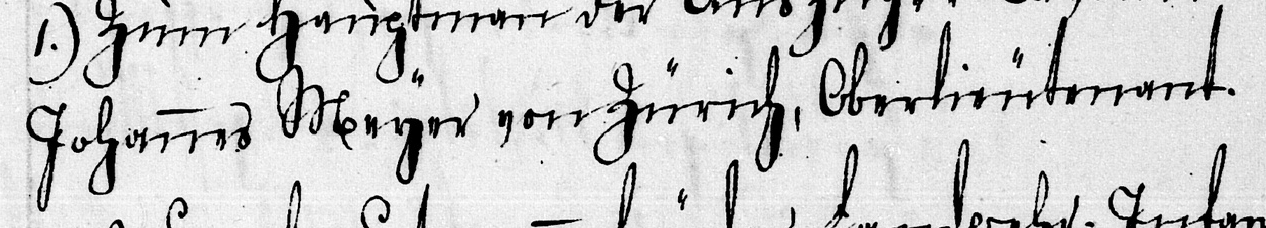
Johannes Meyer von Zürich, Oberlieutenant.
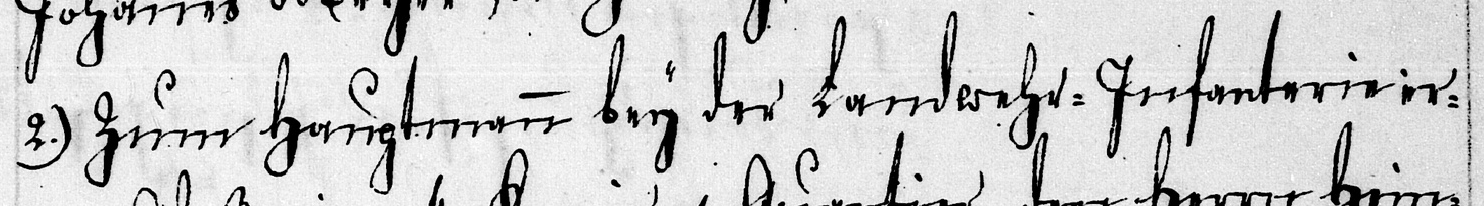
2.) Zum Hauptmann bey der Landwehr-Infanterie er¬
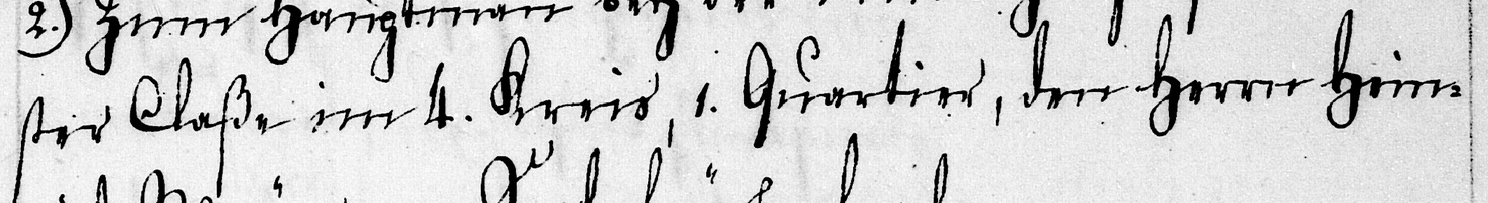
ster Claße im 4. Kreis, 1. Quartier, den Herrn Hein¬
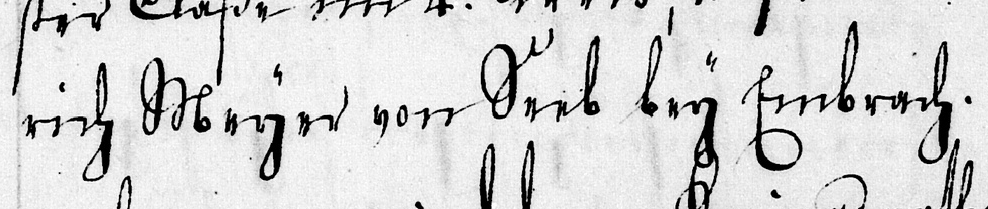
rich Meyer von Seeb bey Embrach.
